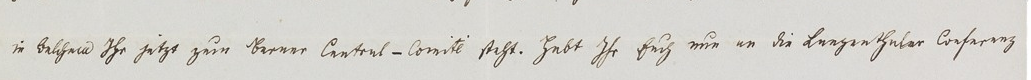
in welchem Ihr jetzt zum Berner Central-Comité steht. Habt Ihr Euch nun an die Langenthaler Conferenz
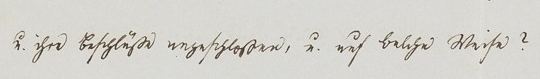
u. ihre Beschlüße angeschloßen, u. auf welche Weise?
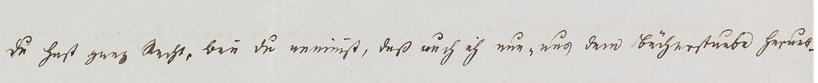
Du hast ganz Recht, wenn du annimmst, daß auch ich nun «aus dem Bücherstaube heraus-
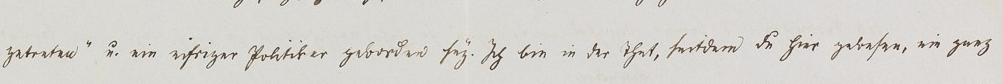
getreten» u. ein eifriger Politiker geworden sey. Ich bin in der That, seitdem du hier gewesen, ein ganz
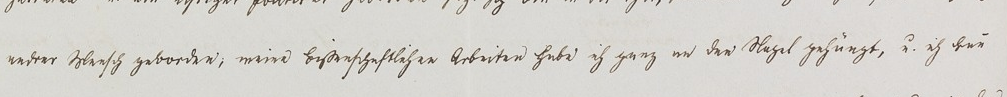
andrer Mensch geworden; meine wißenschaftlichen Arbeiten habe ich ganz an den Nagel gehängt, u. ich kann
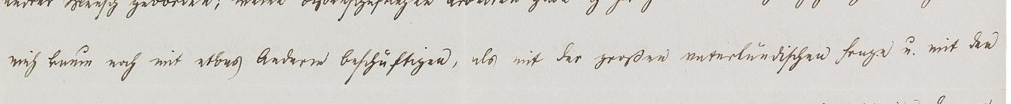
mich kaum noch mit etwas Anderm beschäftigen, als mit der großen vaterländischen Frage u. mit den
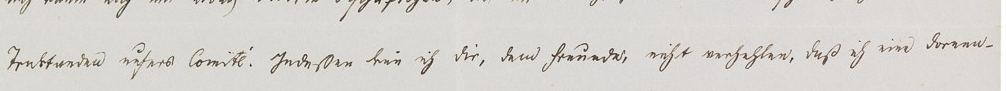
Traktanden unsers Comité. Indeßen kann ich dir, dem Freunde, nicht verhehlen, daß ich eine dornen-
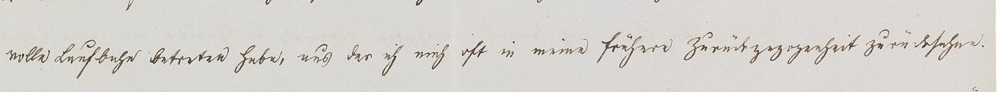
volle Laufbahn betreten habe, aus der ich mich oft in meine frühere Zurückgezogenheit zurücksehne.
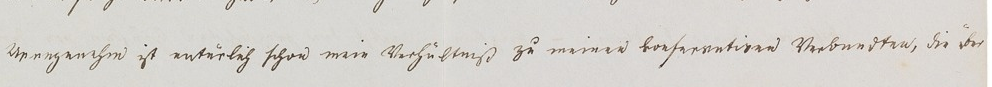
Unangenehm ist natürlich schon mein Verhältniß zu meinen konservativen Verwandten, die über
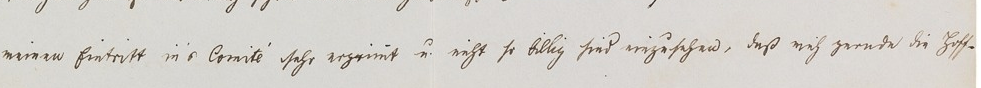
meinen Eintritt in's Comité sehr ergrimmt u. nicht so billig sind einzusehen, daß mich gerade die Hoff-
